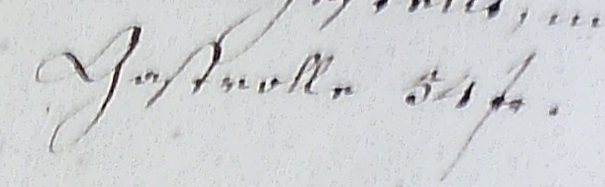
Gastrolle 54 fr.
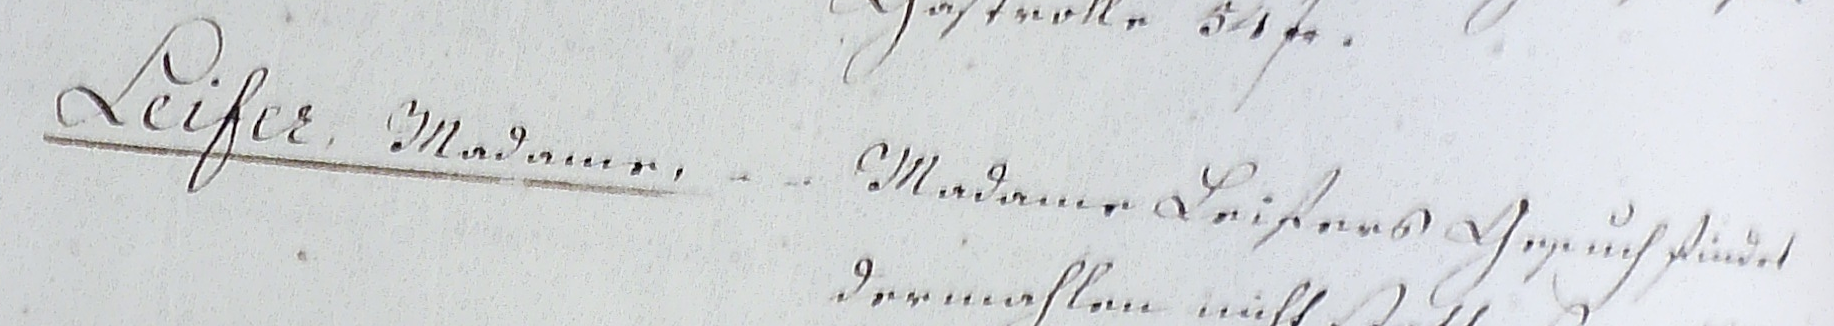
Leifer, Madame, .. .. Madame Leifers Gesuch findet
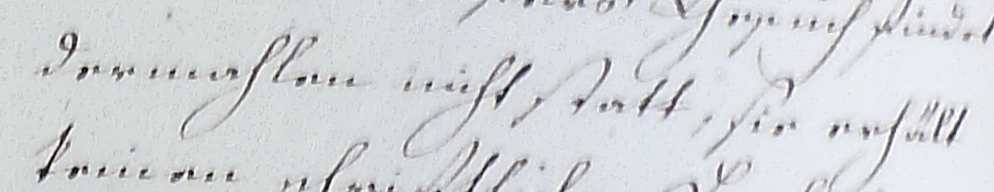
dermahlen nicht statt, sie erhält
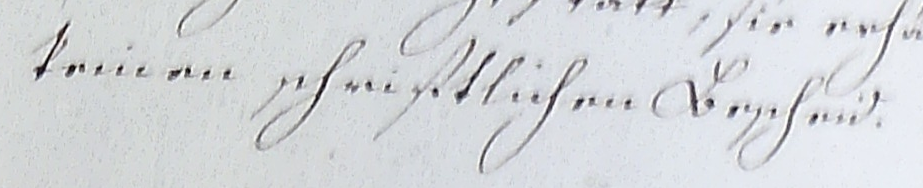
keinen schriftlichen Bescheid.
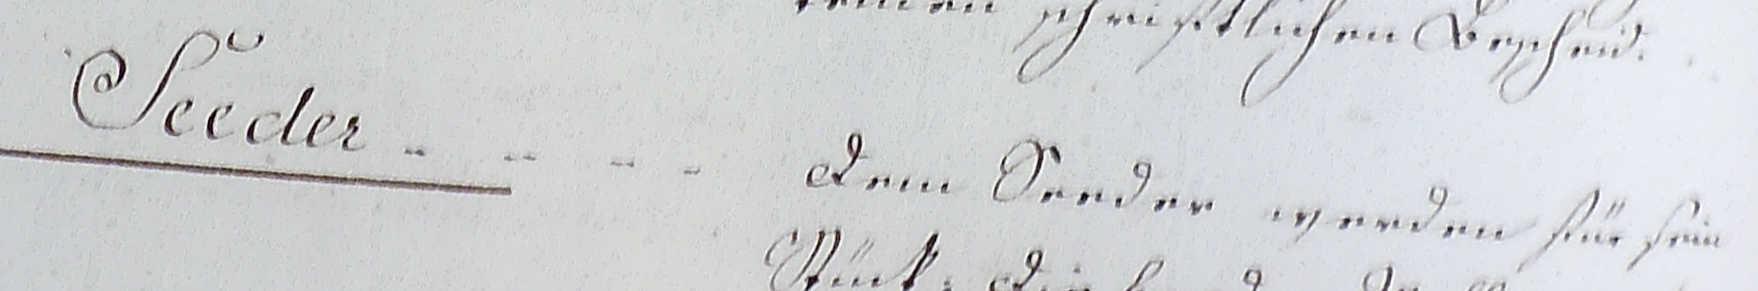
Seeder .. .. .. .. Dem Seeder werden für sein
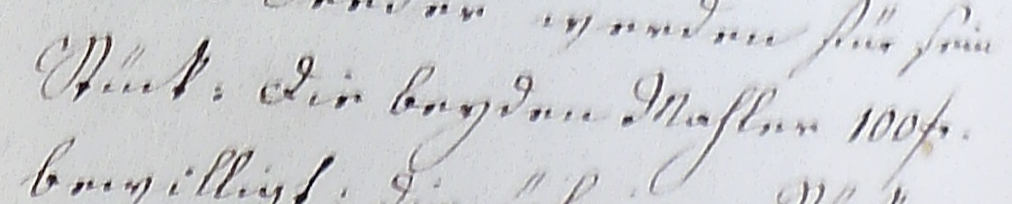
Stück: Die beyden Mahler 100fr.
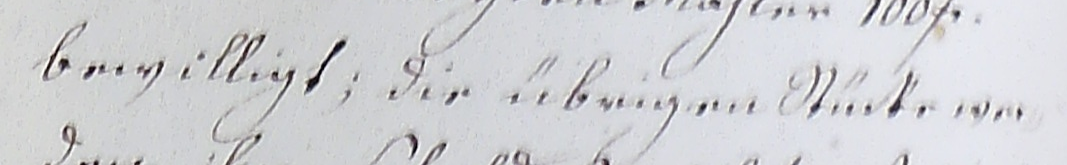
bewilligt; die übrigen Stücke wer¬
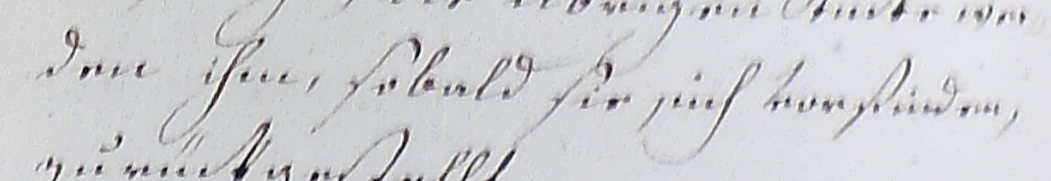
den ihm, sobald sie sich vorfinden,
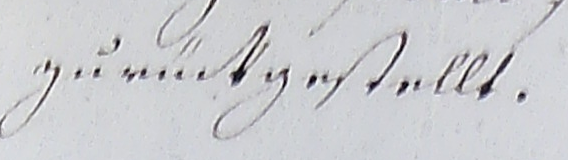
zurückgestellt.
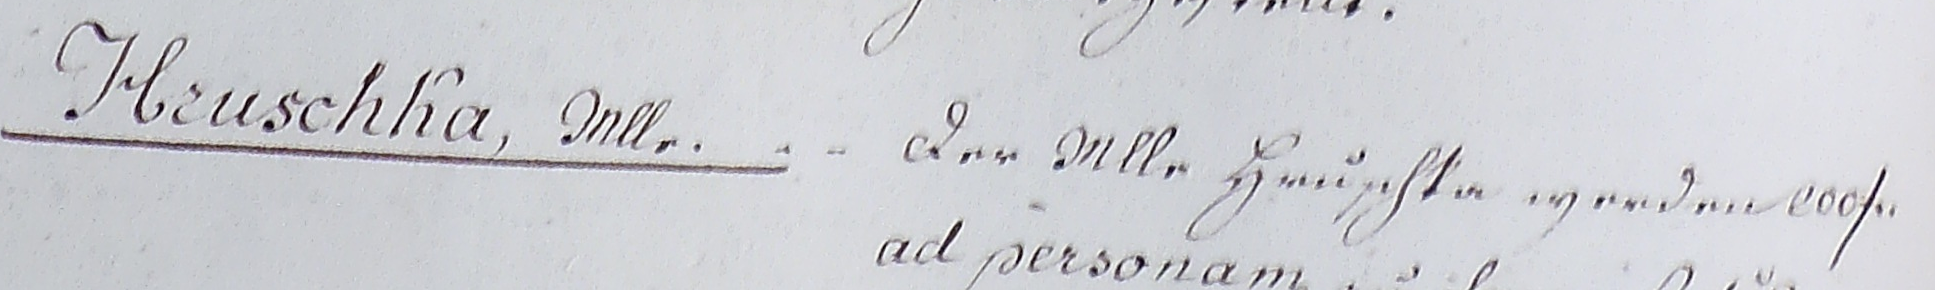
Hruschka, Mlle. .. .. Der Mlle Hruschka werden 800fr.
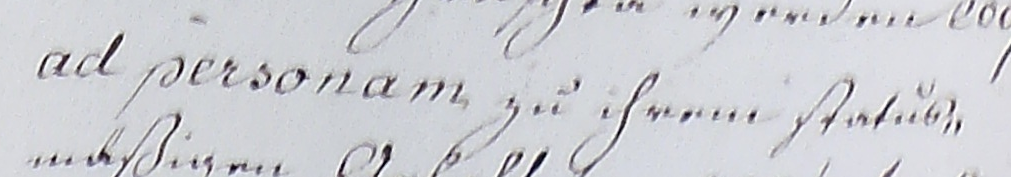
ad personam zu ihrem status¬
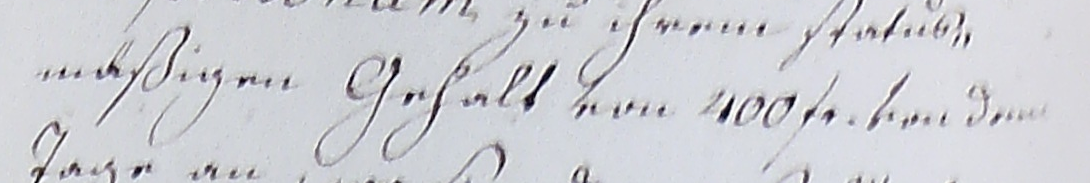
mäßigen Gehalt von 400 fr. von dem
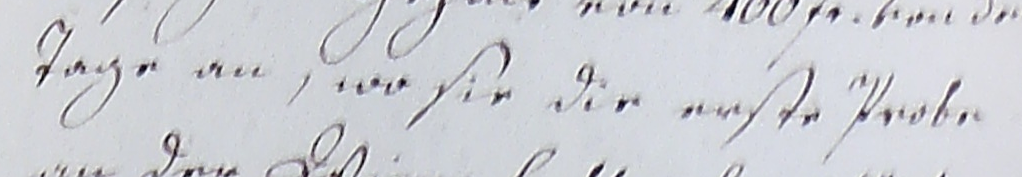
Tage an, wo sie die erste Proe
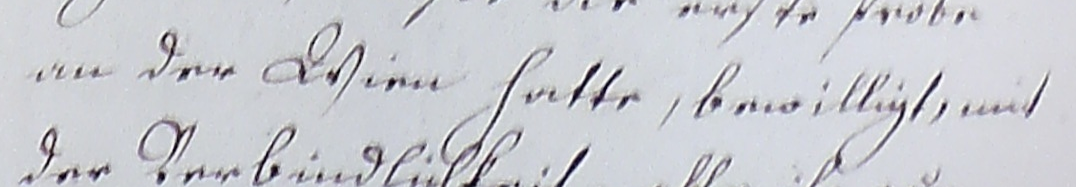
an der Wien hatte, bewilligt, mit
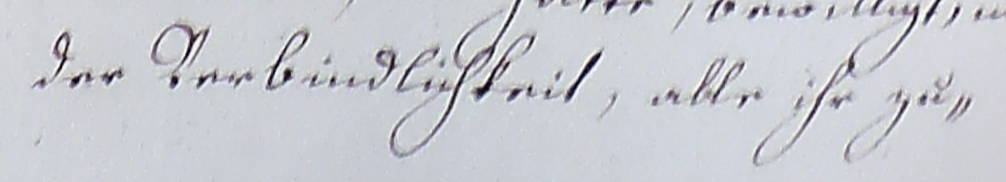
der Verbindlichkeit, alle ihr zu¬
